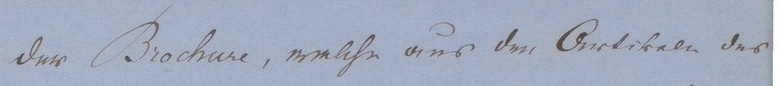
der Brochure, welche aus den Artikeln des
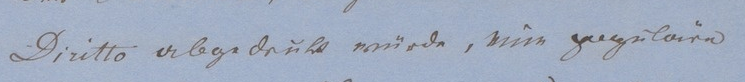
Diritto abgedrukt würde, eine populäre
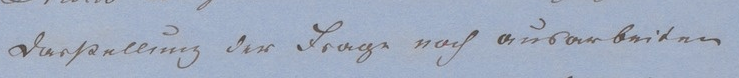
Darstellung der Frage noch ausarbeiten
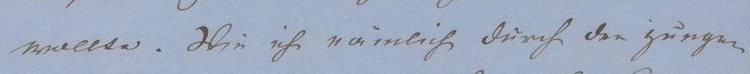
wollte. Wie ich nämlich durch den jungen
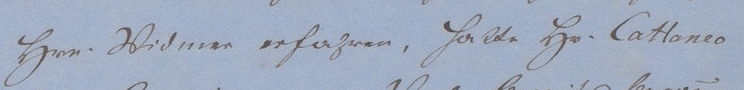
Hrn. Widmer erfahren, hatte Hr. Cattaneo
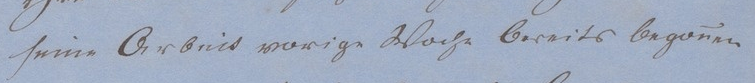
seine Arbeit vorige Woche bereits begonnen
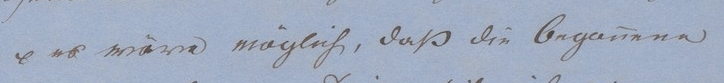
& es wäre möglich, daß die begonnene
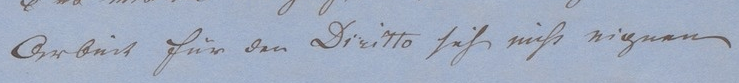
Arbeit für den Diritto sich nicht eignen
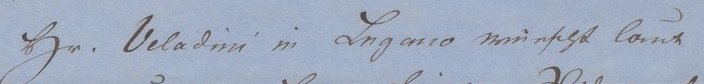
Hr. Veladini in Lugano wünscht laut
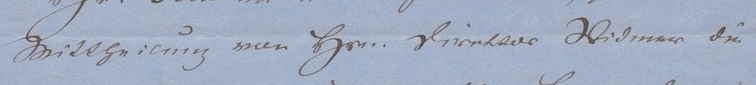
Mittheilung von Hrn. Direktor Widmer die
